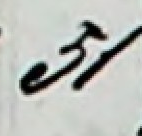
51
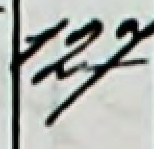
127
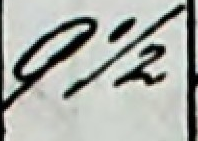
9 1/2
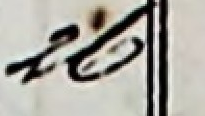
26
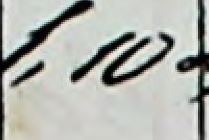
1,10
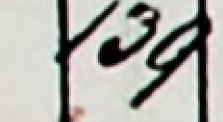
139
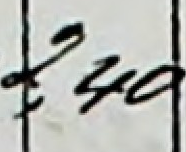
2,40
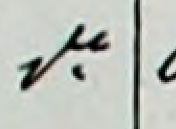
Do
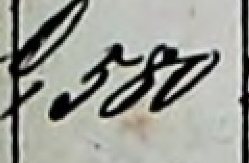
0,580
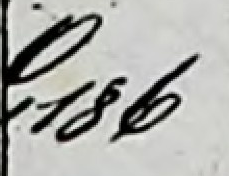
0,186
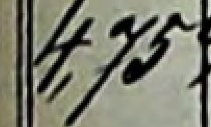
4,75
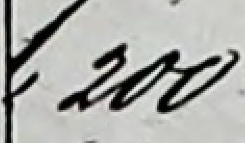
1,200
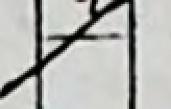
7
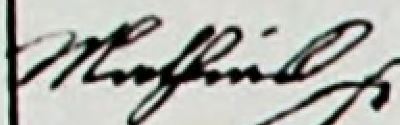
Mathias
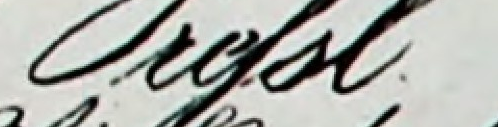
Pressl
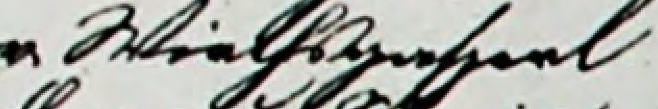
v. Wielhsgaszerl
